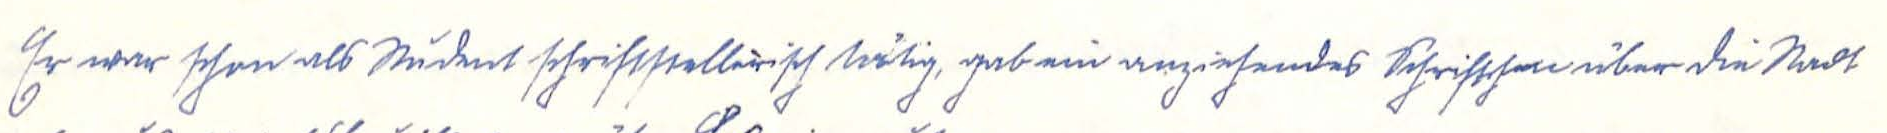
Er war schon als Student schriftstellerisch tätig, gab ein anziehendes Schriftchen über die Stadt
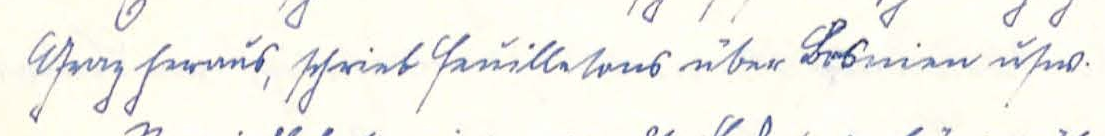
Graz heraus, schrieb Feuilletons über Bosnien usw.
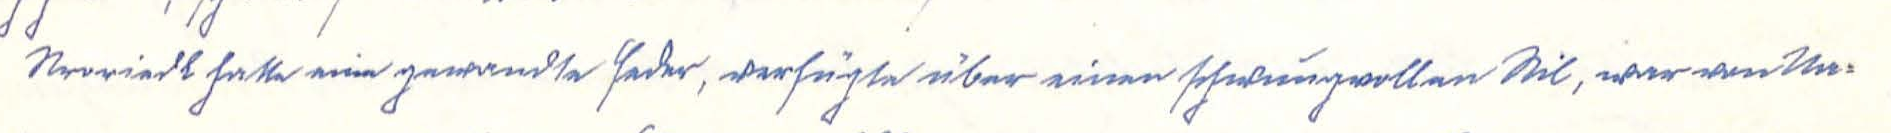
Stroriedl hatte eine gewandte Feder, verfügte über einen schwungvollen Still, war von Na-
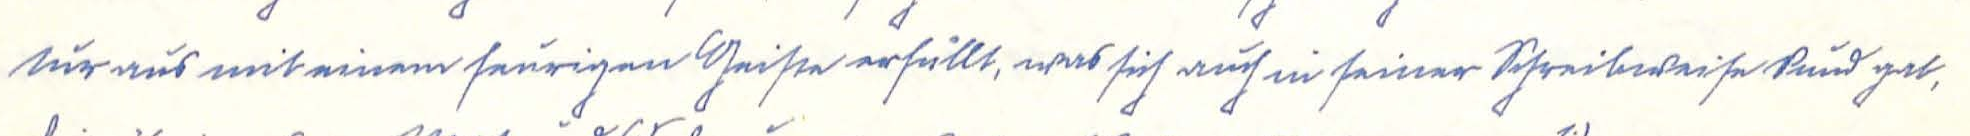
tur aus mit einem feurigen Geiste erfüllt, was sich auch in seiner Schreibweise kund gab,
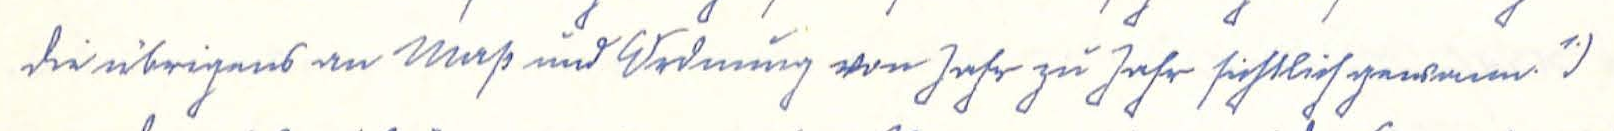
die übrigens an Maß und Ordnung von Jahr zu Jahr sichtlich gewann.
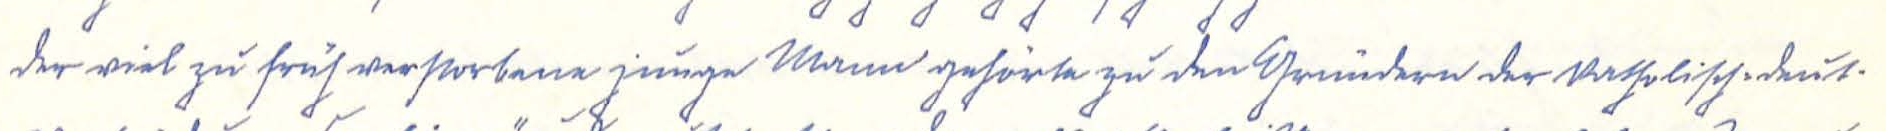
Der viel zu früh verstorbene junge Mann gehörte zu den Gründern der katholisch-deut-
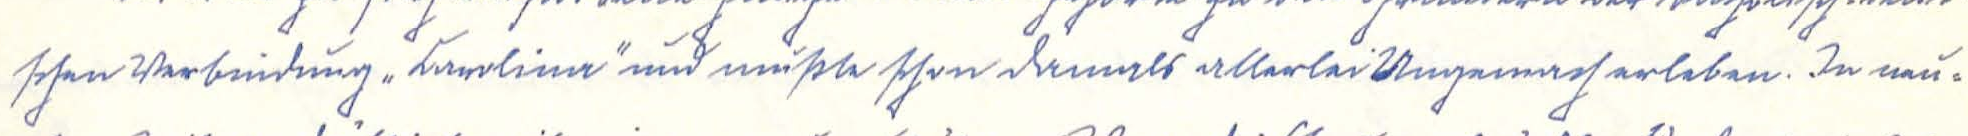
schen Verbindung "Carolina" und musste schon damals allerlei Ungemach erleben. In neu-
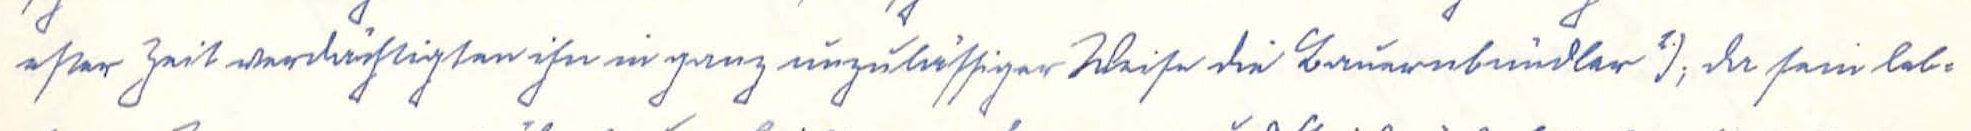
ester Zeit verdächtigten ihn in ganz unzulässiger Weise die Bauernbündler 2.), da sein leb-
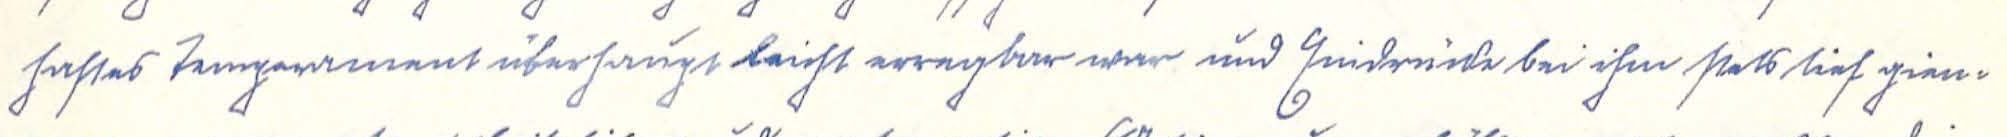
haftes Temperament überhaupt leicht erregbar war und Eindrücke bei ihm stets tief gin-
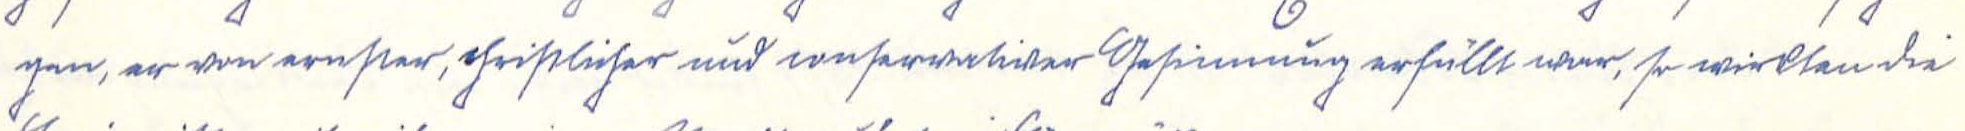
gen, er von ernster, christlicher und konservativer Gesinnung erfüllt war, so wirkten die
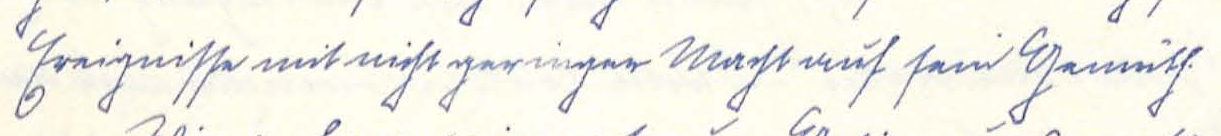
Ereignisse mit nicht geringer Macht auf sein Gemüth.
